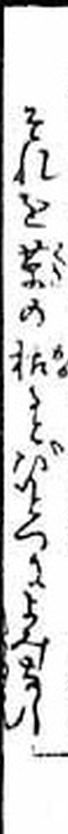それを草の枯るとひとつによみなし
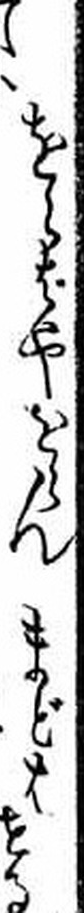をらばやをらんまどはせる
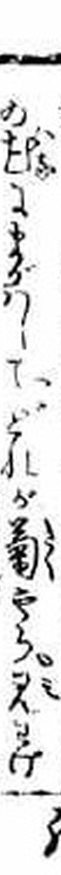の花にまがはしてどれが菊やら見わけ河
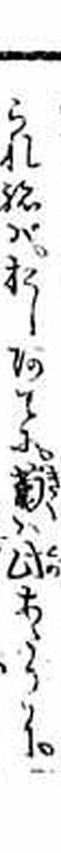られねばおしあてに菊は之にあたりに
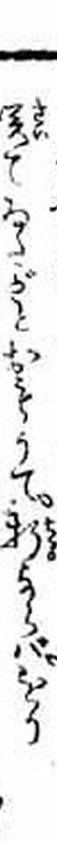咲てゐたがとおもうて折ならばをり
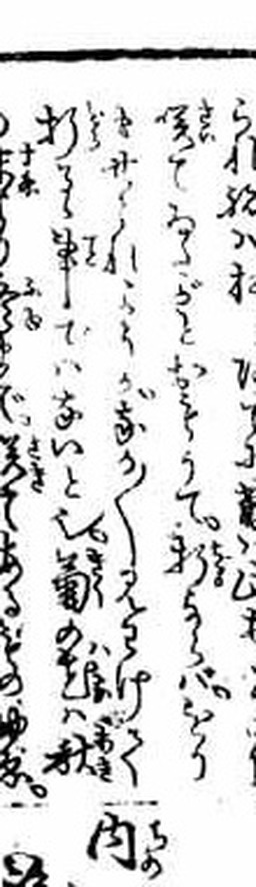もせられようがなか〳〵見わけて内
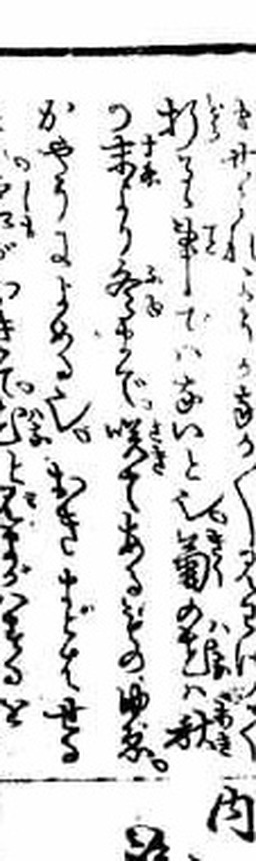の末より冬まで咲てあるものゆゑ躬
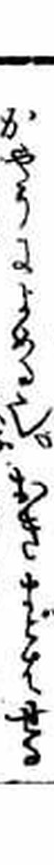かやうによめる也おきまどはせる
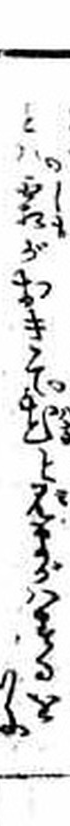とは霜がおきて花とみまがはするをいふ恒

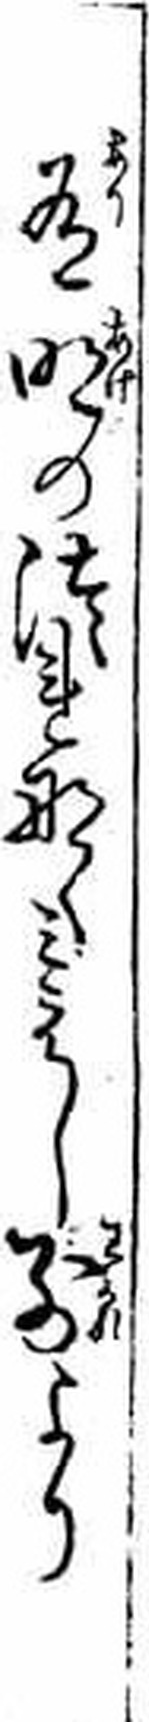有明のつれなくみえし別より
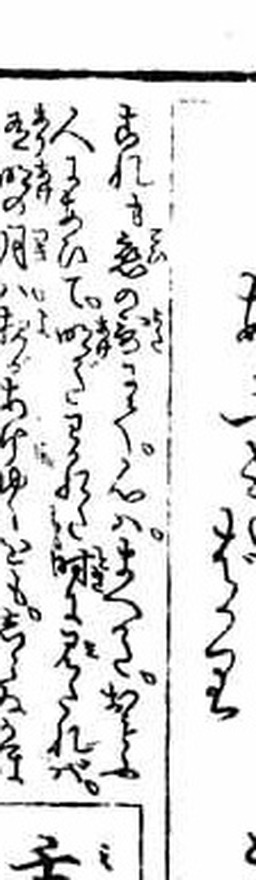これも恋の哥にて心はまへにおもふ
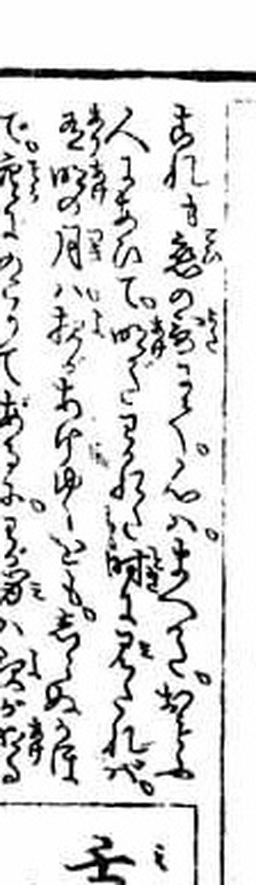人にあひて明がたわかれた時に見たれば壬
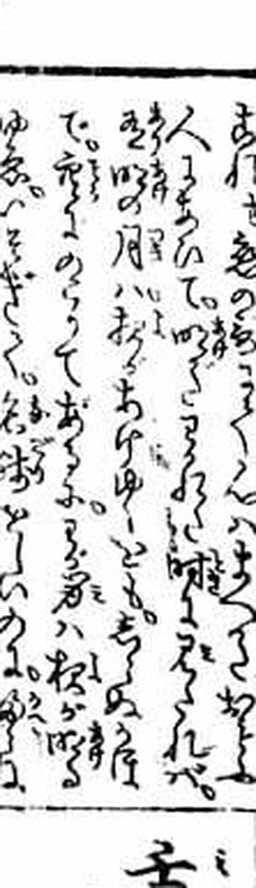有明の月は夜があけゆくともしらぬかほ生
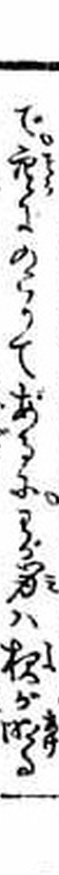で空にのこりてあるにわが身は夜が明る
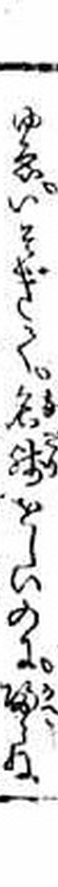ゆゑいそぎて名残ををしいのに帰らね
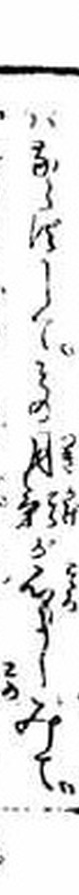はならずしてその月影が心にしみて
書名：小倉百人一首
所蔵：東京学芸大学教育コンテンツアーカイブ
